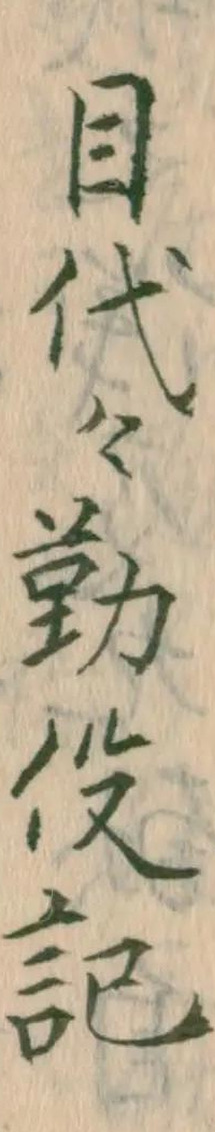目代々勤役記
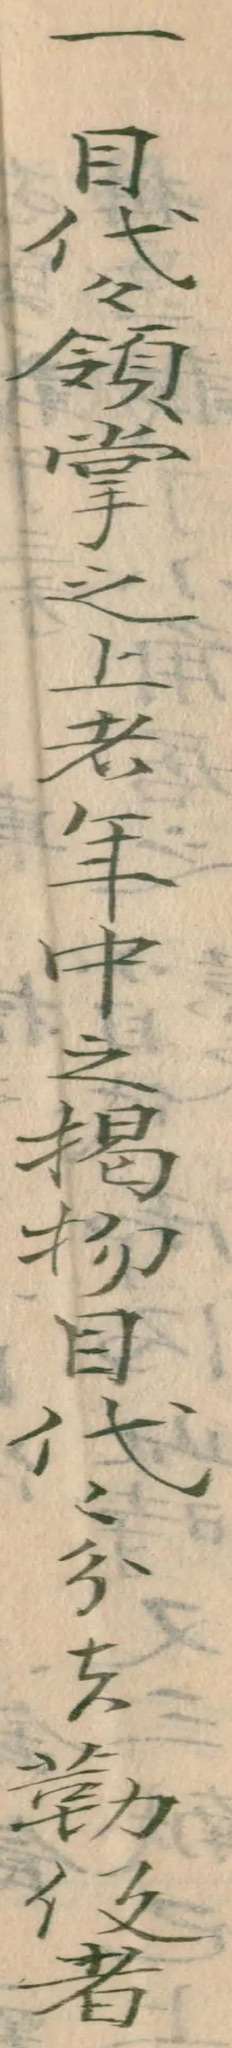一目代々領掌之上者年中之掲物目代々分者勤役者
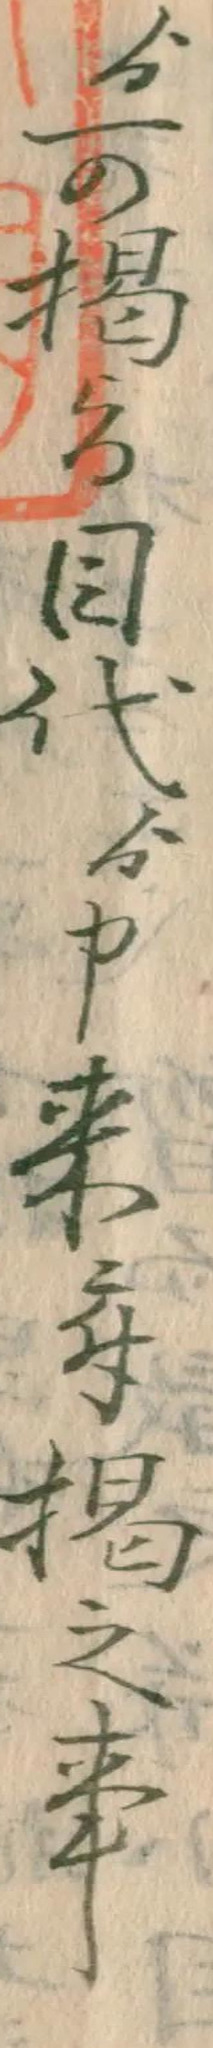ゟ可掲旨目代ゟ申来ニ付掲之事
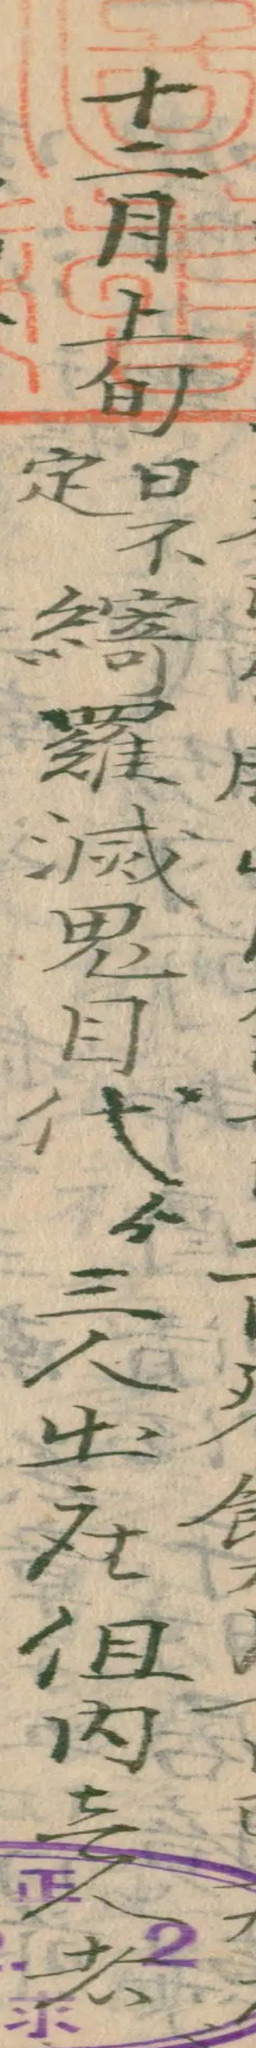一十二月上旬日不定綺羅滅鬼目代ゟ三人出座但内壱人者
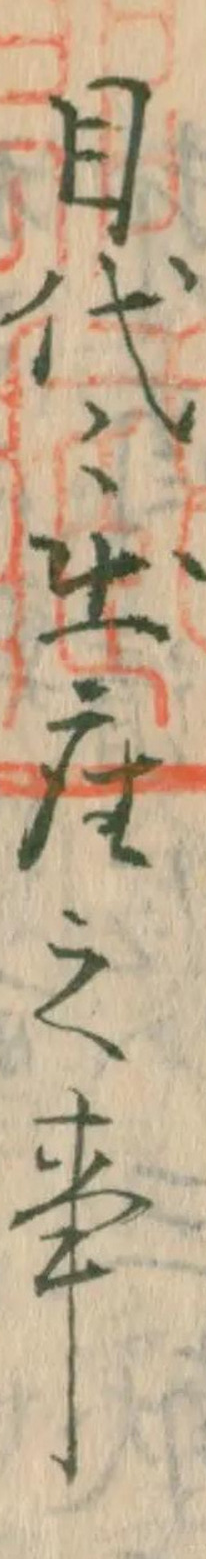目代々出座之事
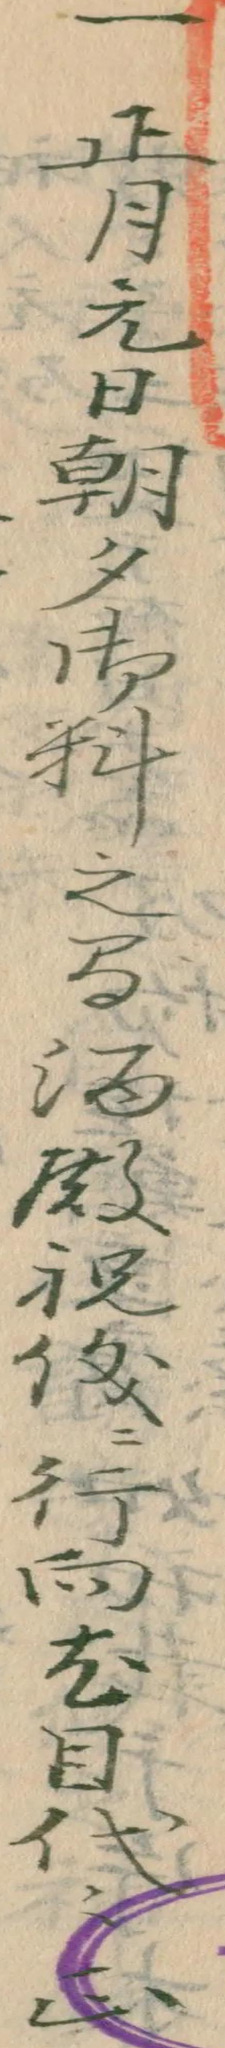一正月元日朝夕御料之間酒殿祝儀ニ行向尤目代々正

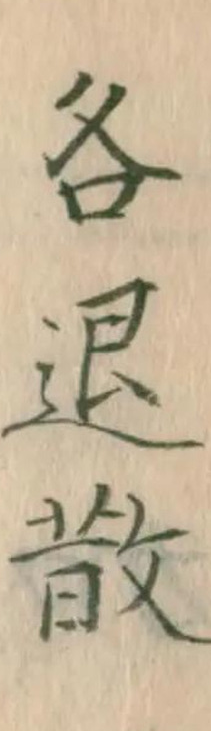各退散
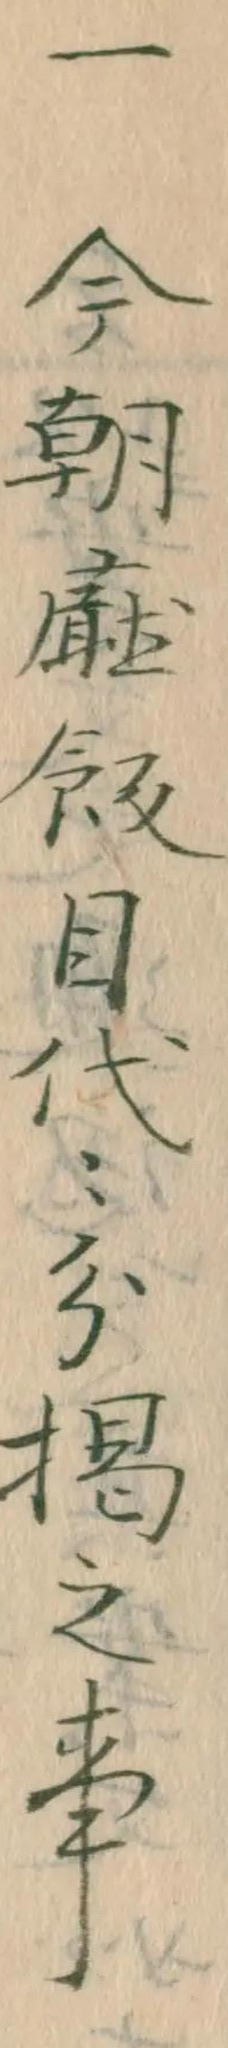一今朝庁飯目代々分掲之事
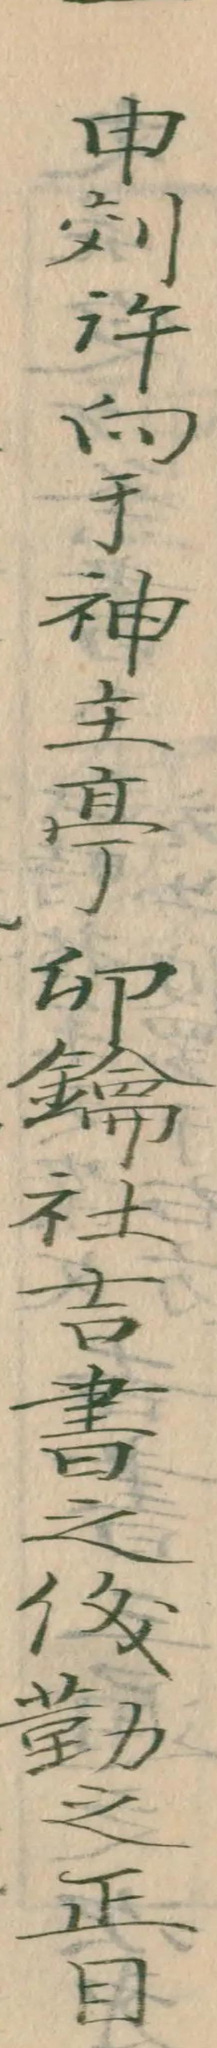一申刻許向于神主亭卯鑰社古書之儀勤之正目
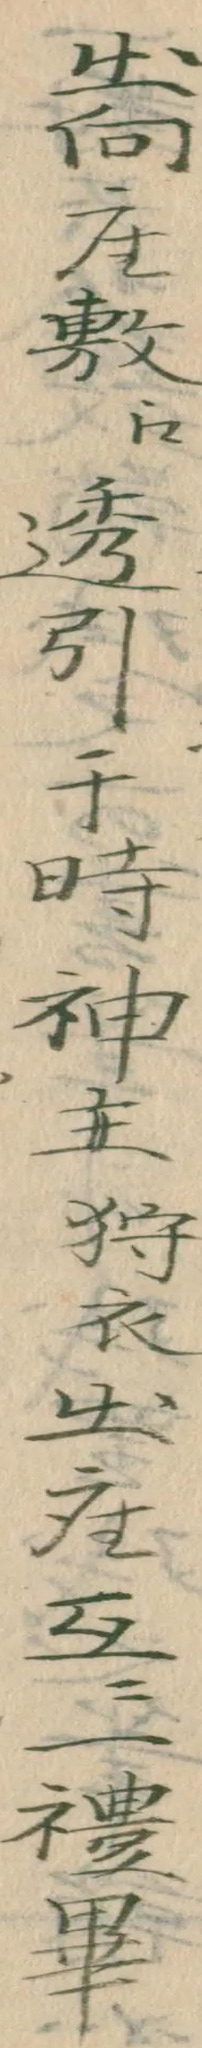出向座敷え透引于時神主狩衣出座互ニ一礼畢
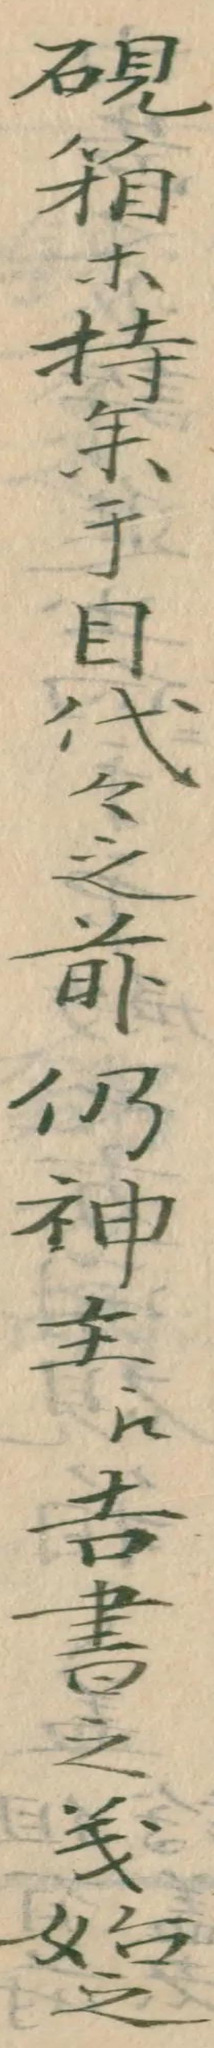硯箱等持参于目代々之前仍神主え𠮷書之義始之

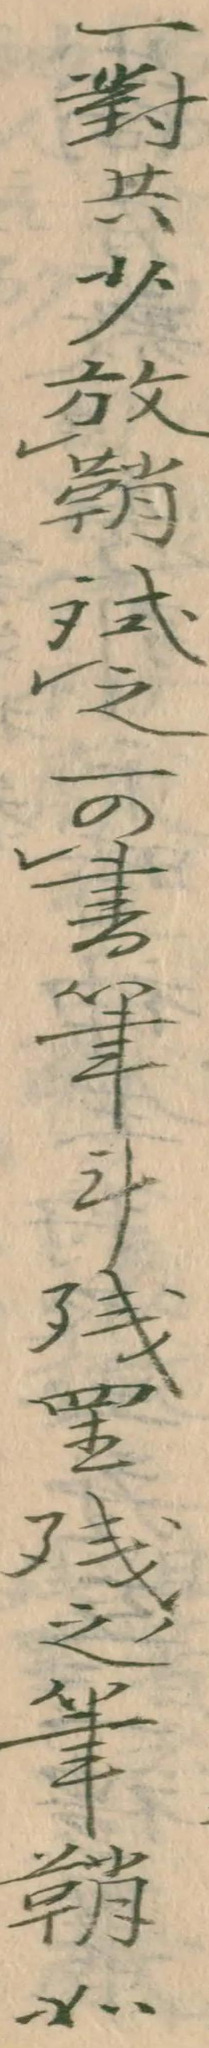一対共少放鞘試之可書筆計残置残之筆鞘如
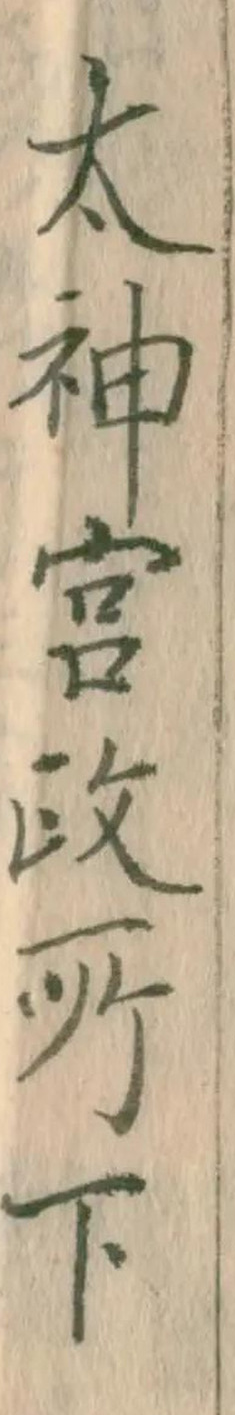太神宮政所下
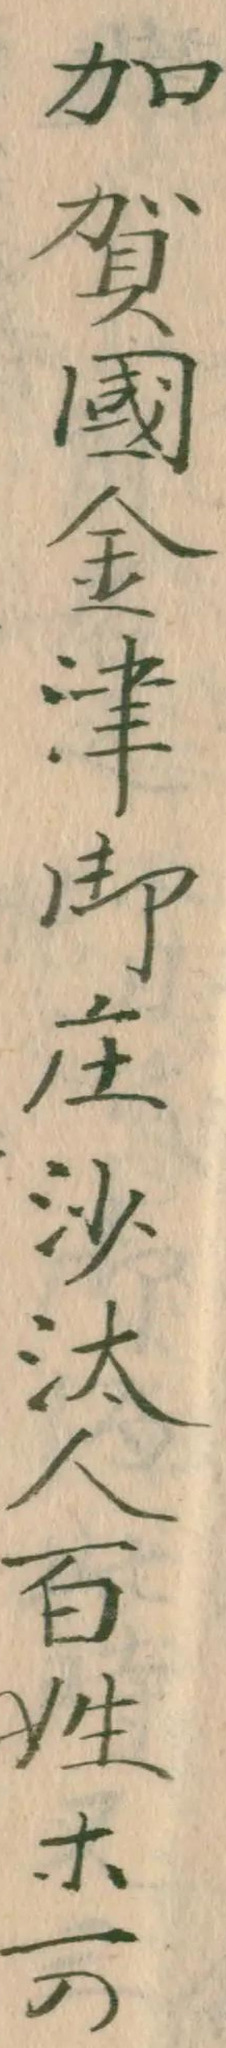加賀国金津御庄沙汰人百姓等可
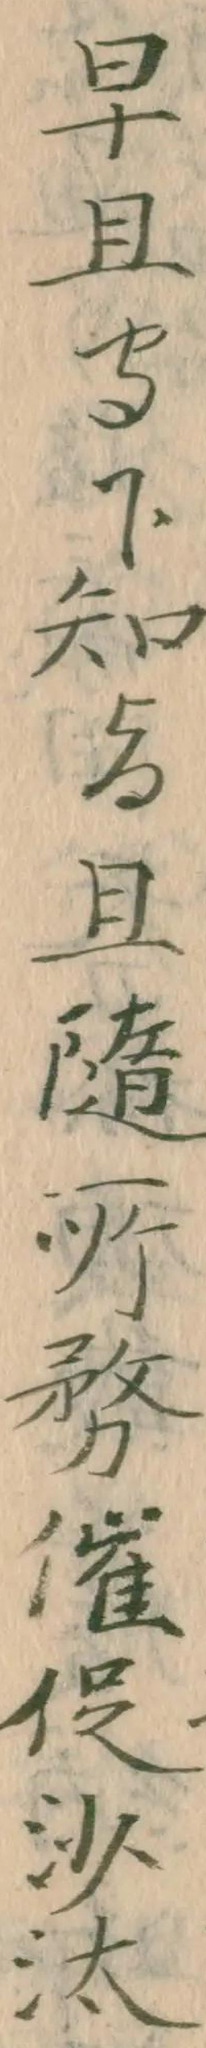早且守下知旨且隨所務催促沙汰
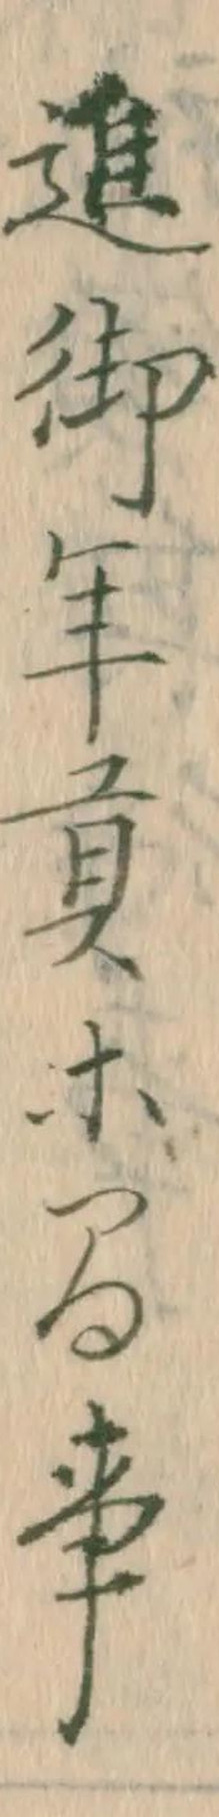進御年貢等間事
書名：賀茂社記録. 第26冊
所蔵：国立国会図書館 National Diet Library, JAPAN
